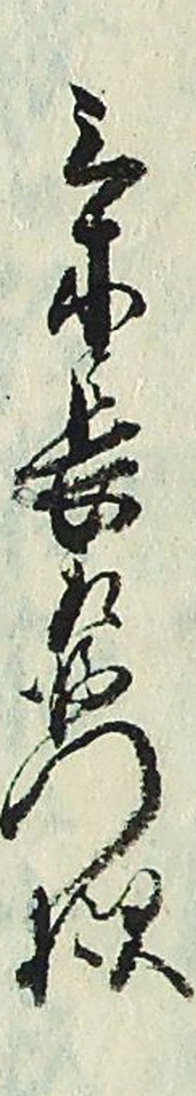三木長左衛門様
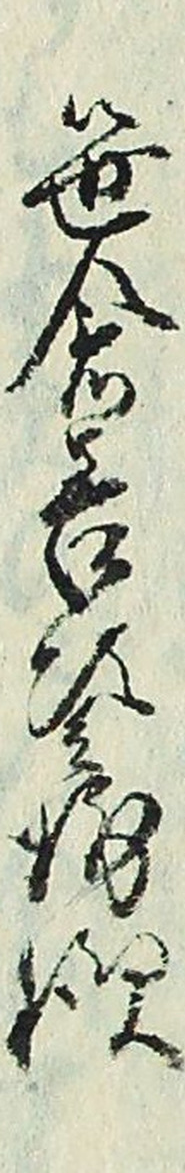笹倉善次兵衛様

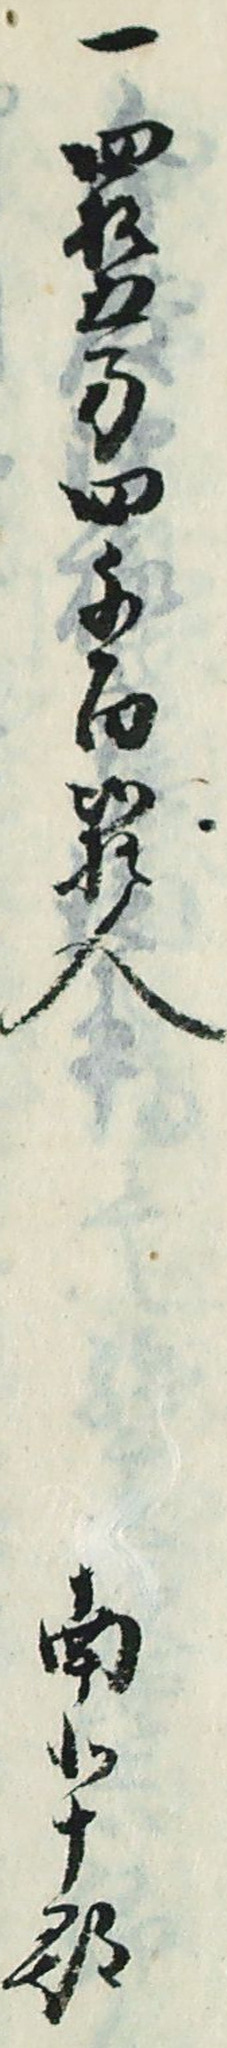一四拾五万四千百弐拾人南北十郡
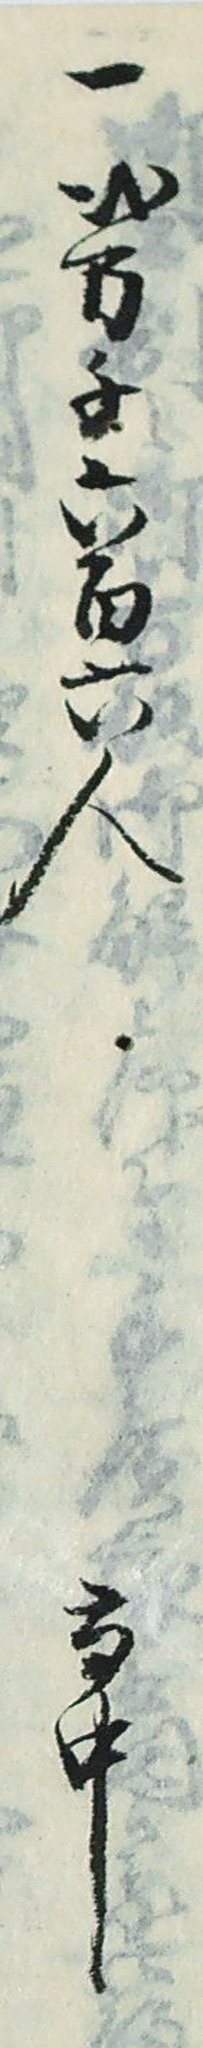一弐万千六百六人市中
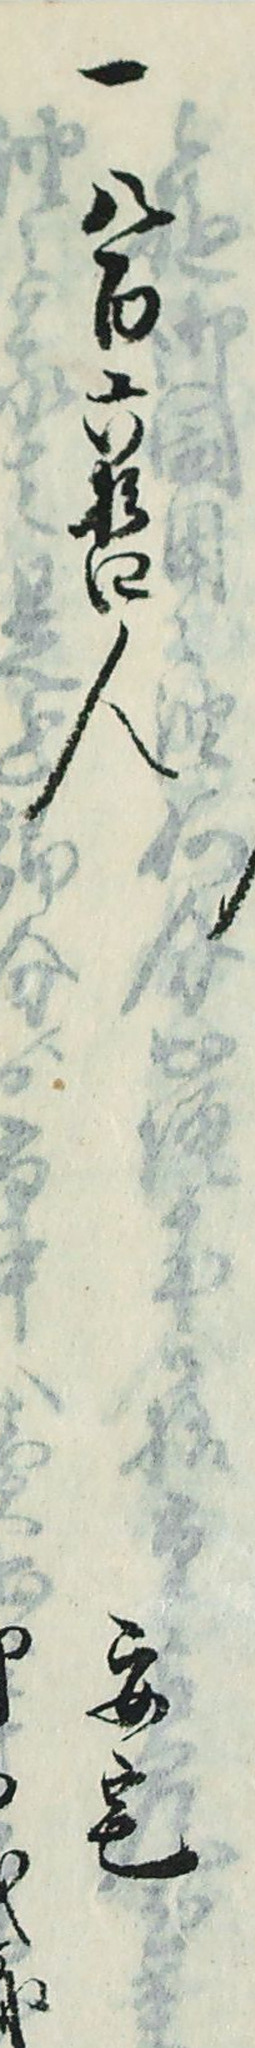一八百六拾四人安宅
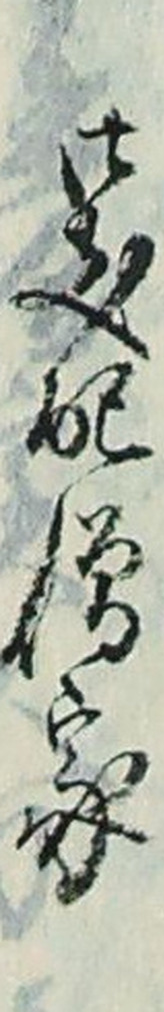御支配僧家
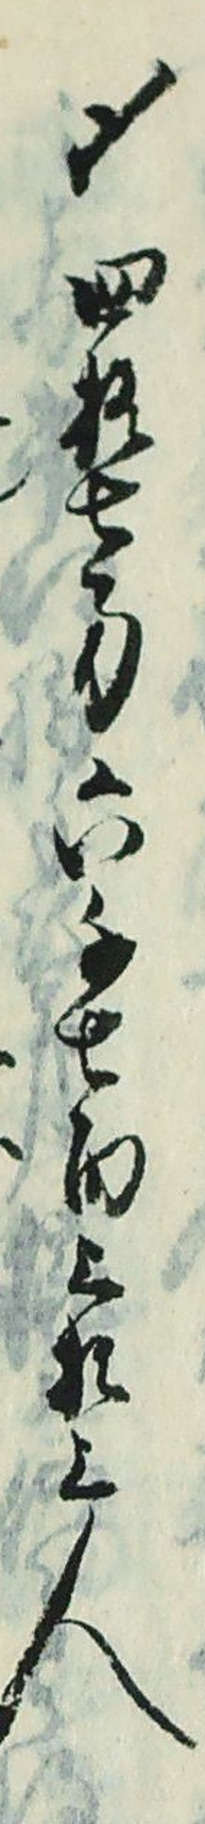〆四拾七万六千七百三拾三人
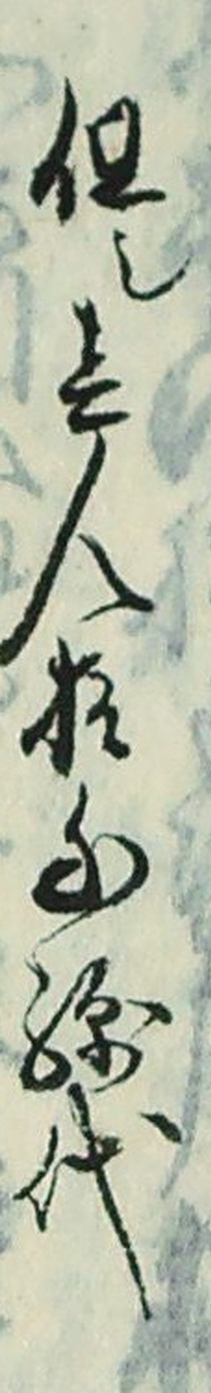但し壱人拾匁綿代
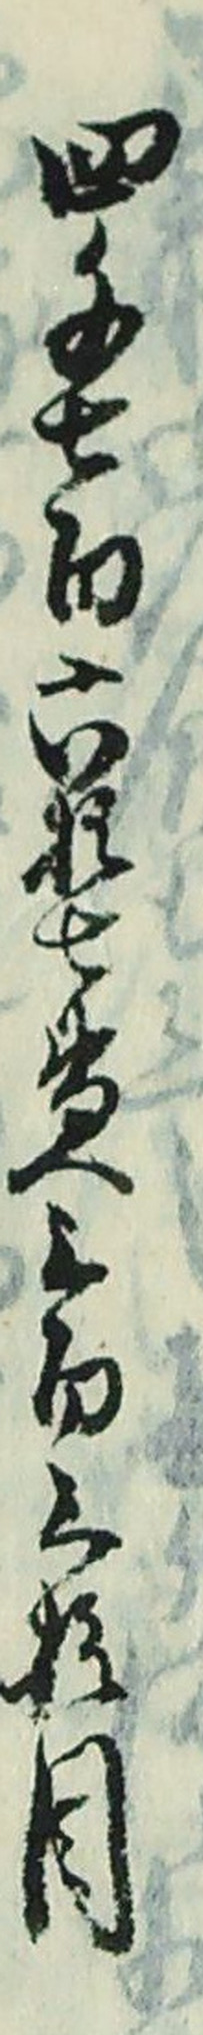四千七百六拾七貫三百三拾目
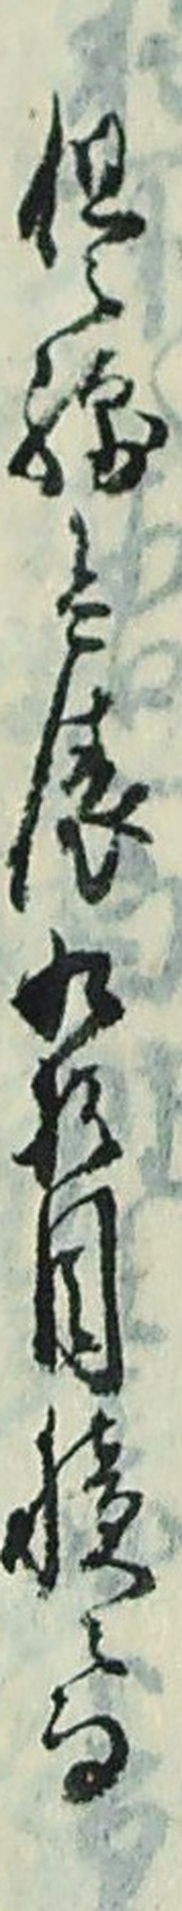但し綿壱俵九拾目積ニ而
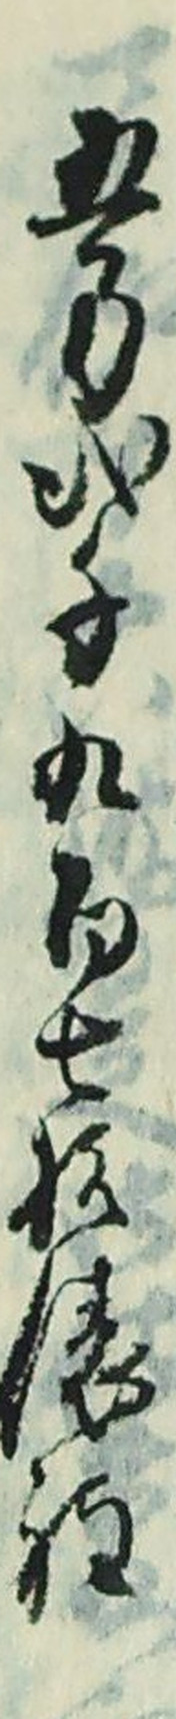五万弐千九百七拾俵程
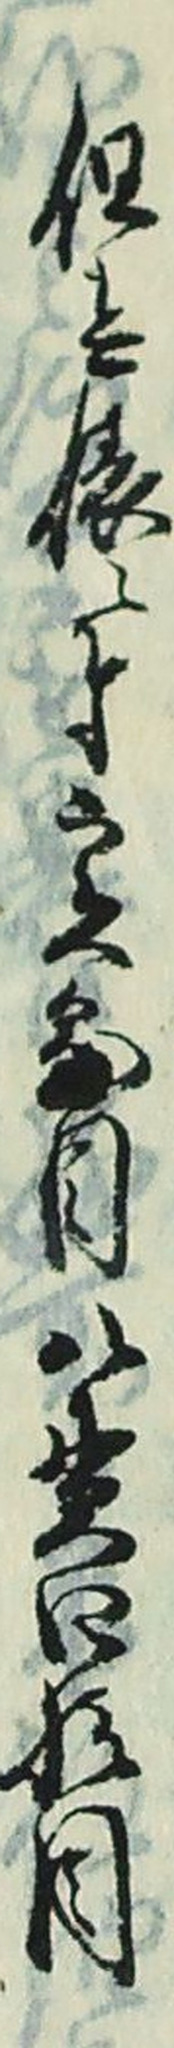但壱俵ニ付実懸目八貫四拾目
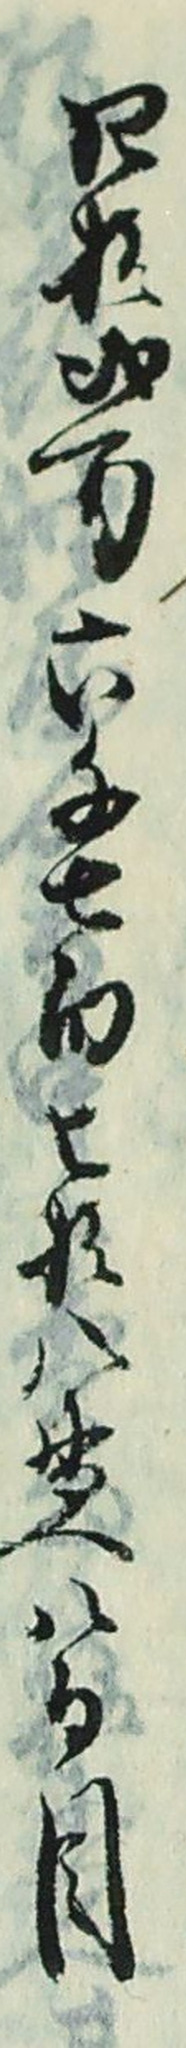四拾弐万六千七百七拾八貫八百目
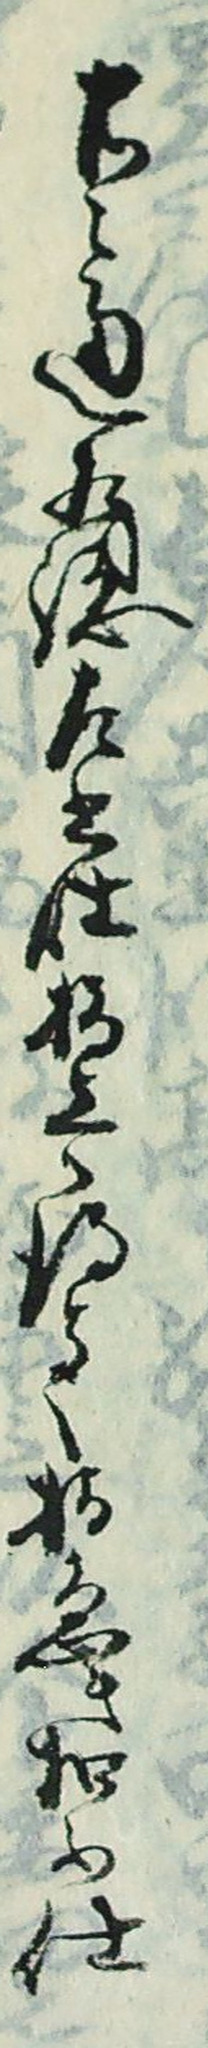右之通相認左書仕指上候得とも指急キ扣不仕
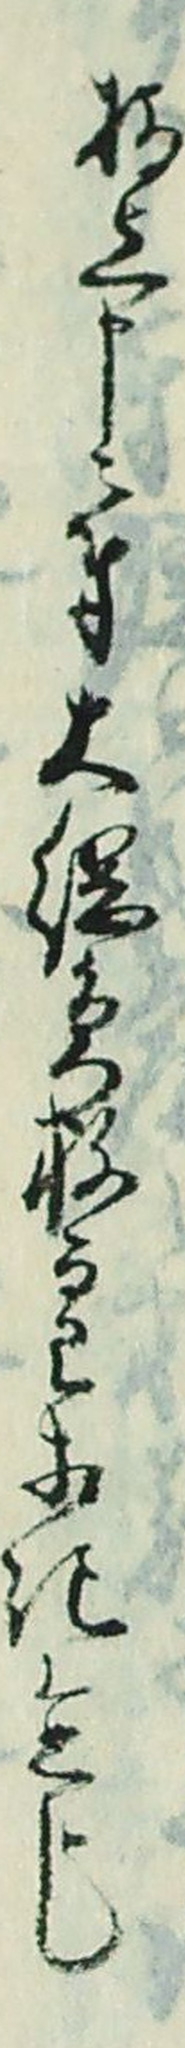指上申ニ付大綱員枚而已相記置申候
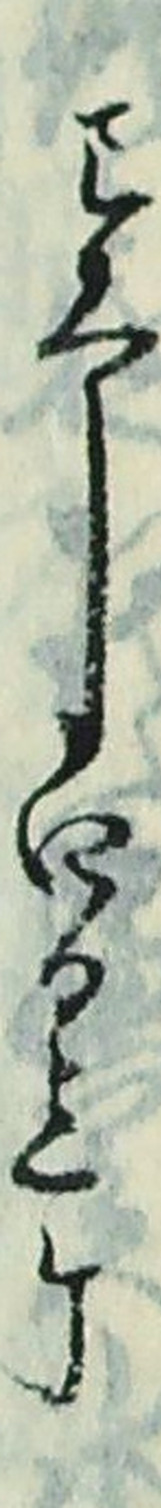巳三月四日上ヶ
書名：油稼御取究ニ附御箇條書テ以被仰渡南北同役申談御答書控
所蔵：鳴門教育大学 Naruto University of Education
